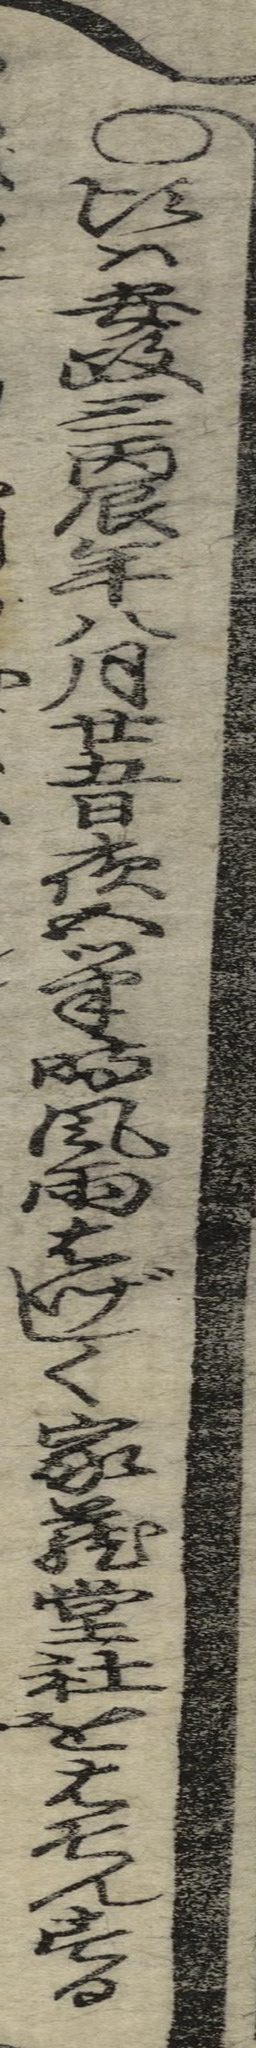〇頃は安政三丙辰年八月廿五日夜五ツ半時風雨はげしく家蔵堂社をはそんする
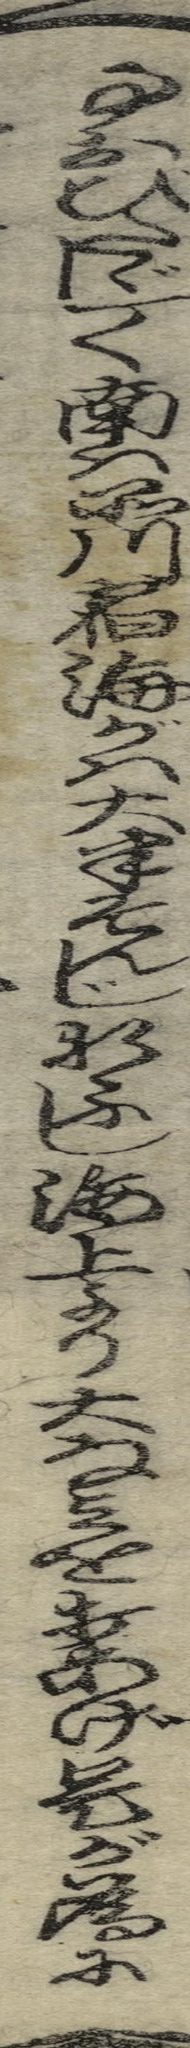事おびたゞしく南は品川宿海がは大半そんじ折ふし海上より大なみを打あげ是が為に
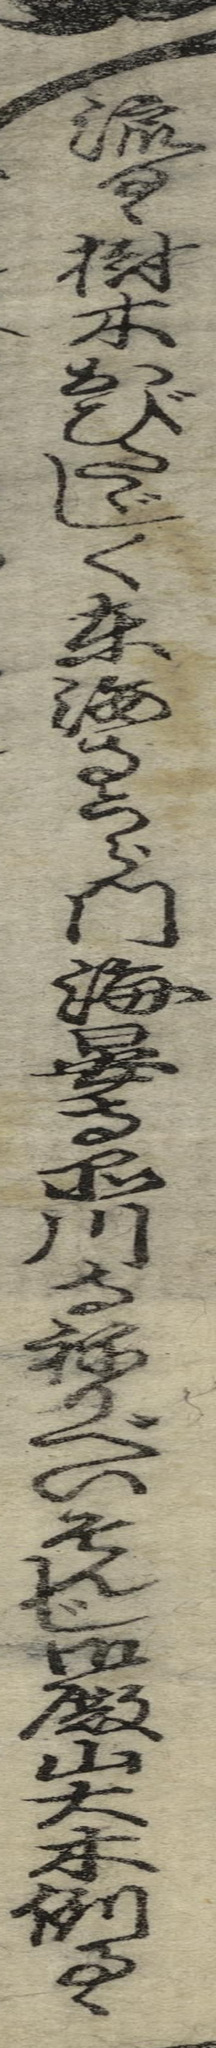流るゝ樹木おびたゞしく東海寺うら門海晏寺品川寺ねりべいそんじ御殿山大木例事く
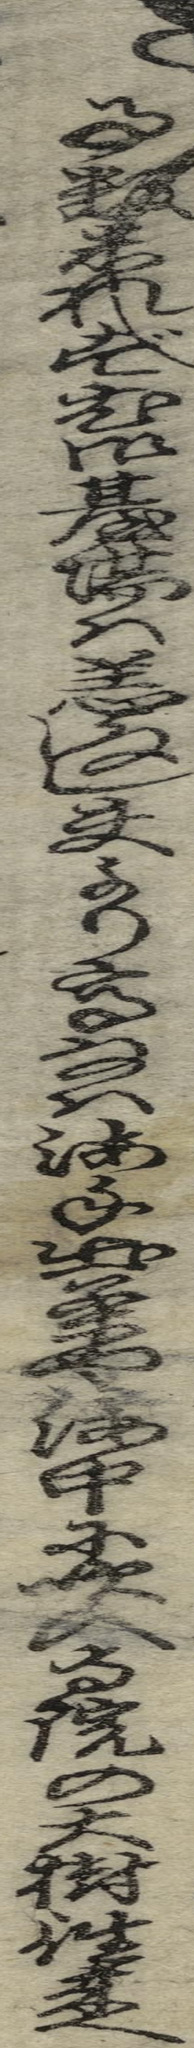事数しれず尤御台場は恙なし夫より高なは海手出萬海中に吹入寺院の大樹往来へ
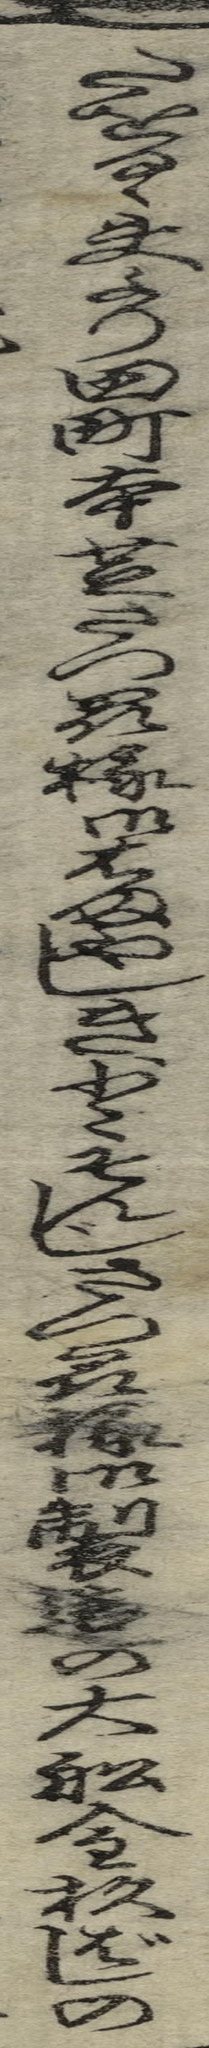たをるゝ夫より田町本芝さつ州様御はまやしき少〻そんじさつ州様御製造の大船金杉ばしの
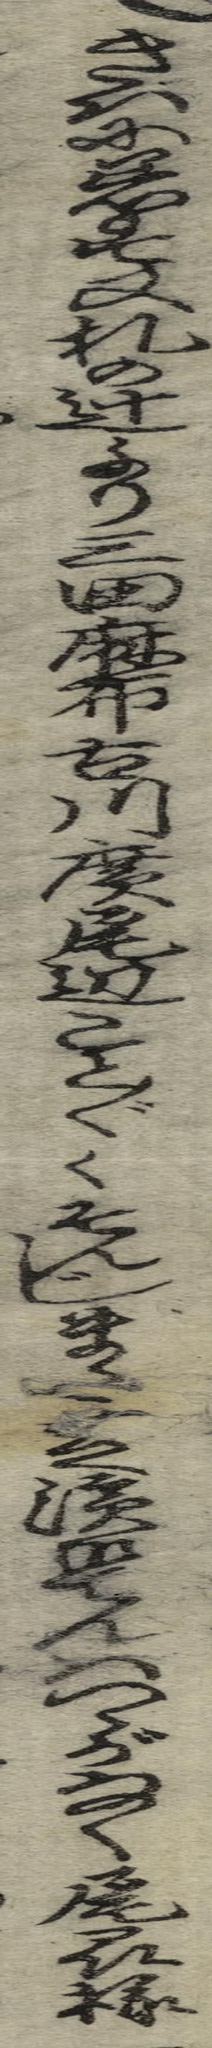きはに着す又札の辻より三田麻布古河広尾辺こと〴〵くそんじまた芝浜御てんはつゝがなく尾州様
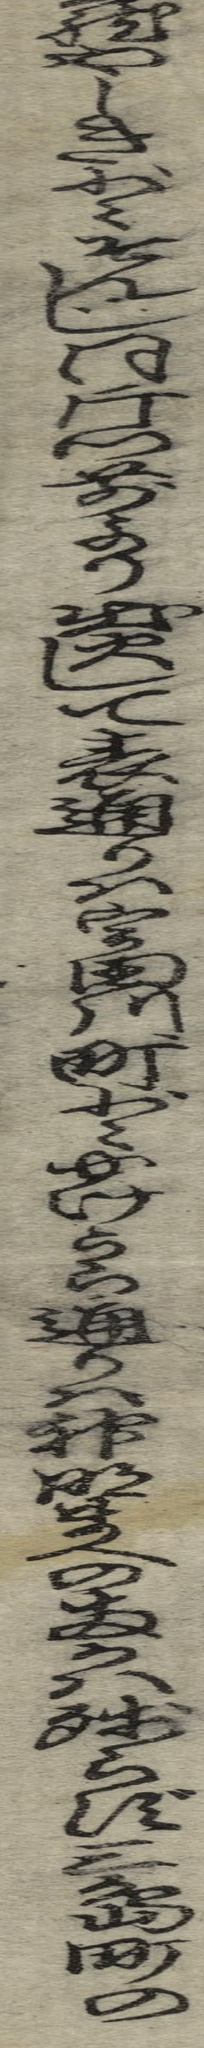御蔵やしき少〻そんじ同御門前より出火して表通りは宇田川町少〻やけうら通りは神明まへの両かは残らず三島町の
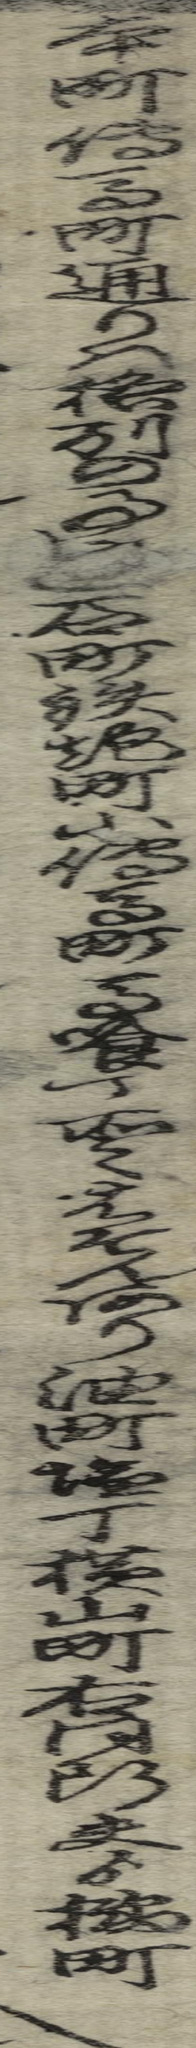本町伝馬町通りは格別の事なし石町鉄炮町小伝馬町馬喰丁所〻はそんあり油町塩丁横山町右同断夫ゟ橘町
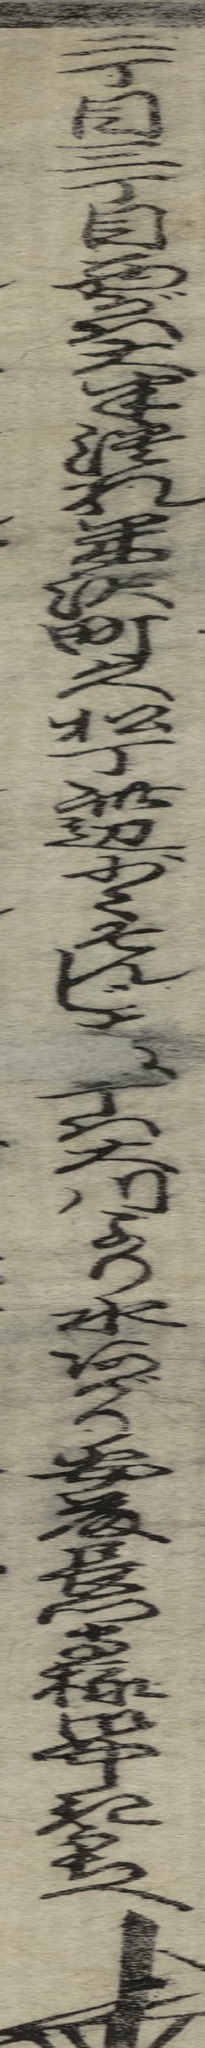二丁目三丁目西がは大半潰れ米沢町久松丁此辺少〻そんじ丁は大川より水あがり安藤長門守様御やしきうちへ
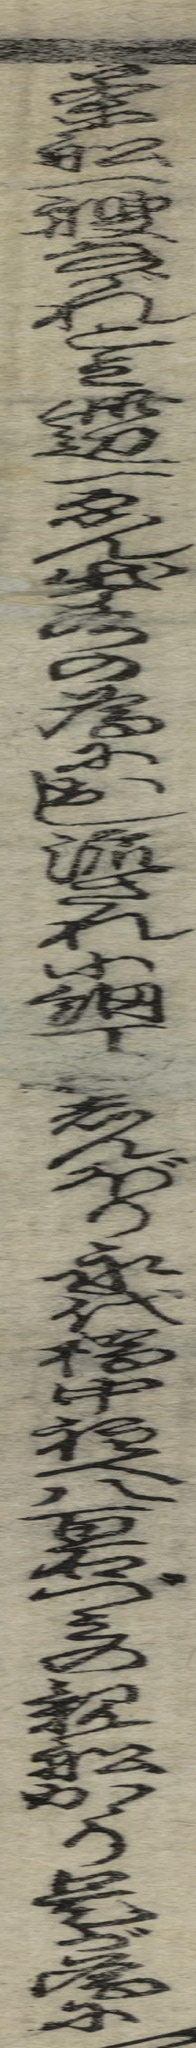茶船一艘ながれこみ此辺一ゑん出水の為におし流され小網丁しんぼり永代橋中程へ八百石づみの親船かゝり是が為に
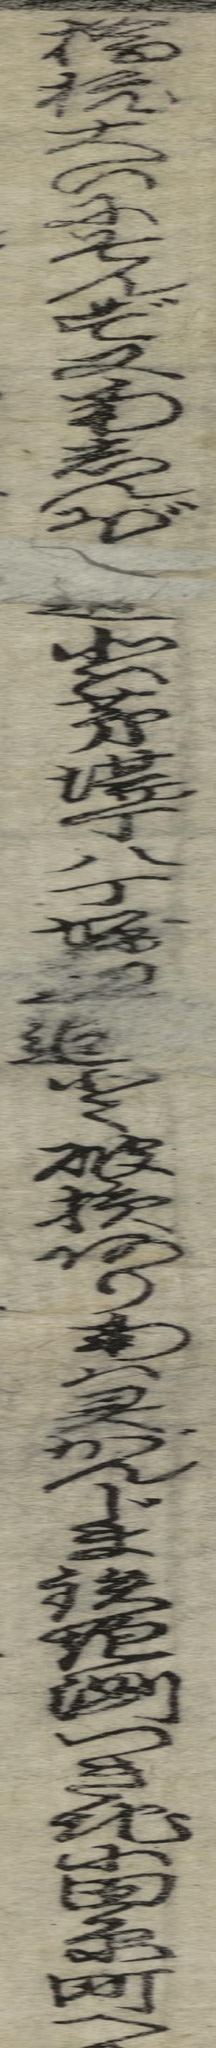橋杭大いにそんず又南しんぼり通北は茅場丁八丁堀辺迄所〻破損あり南は霊がんじま鉄炮洲つき北小田原町へん
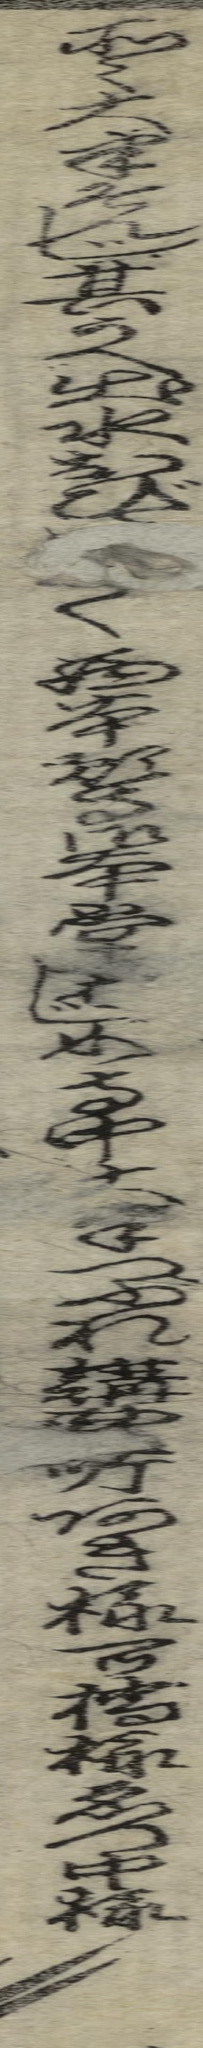所〻大半そんじ其うへ出水おびたゞしく西本願寺御本堂はじめ寺中大半つぶれ講所あき様一つ橋様ゑつ中様
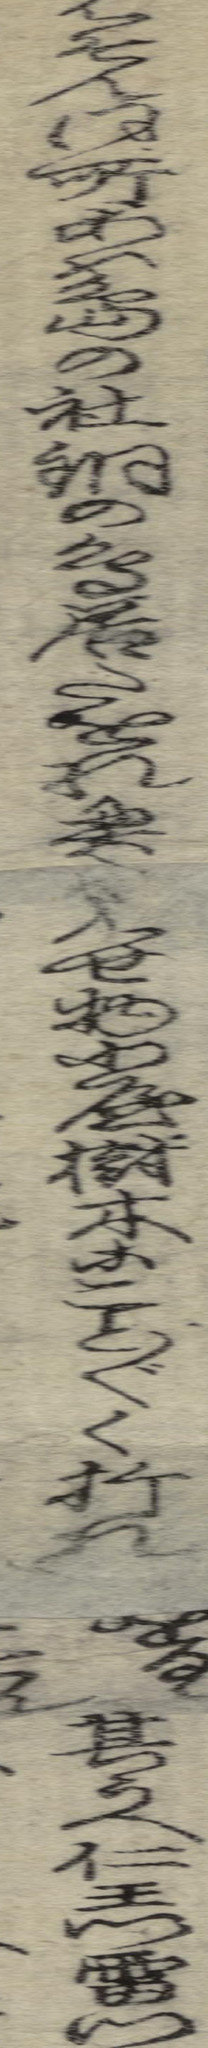はそん同所あは島の社銅の鳥居たをれ奥見せ物小屋樹木等こと〴〵く折れたをるゝ其うへ仁王門雷門の大挑灯
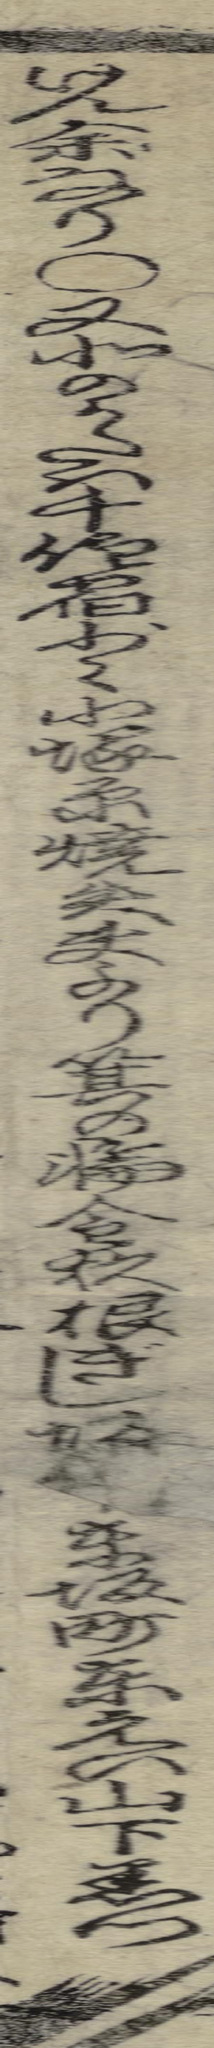けん余なり〇又北のかたは千住宿少〻小塚原焼失夫より箕の輪金杉根ぎし坂東坂町東えい山下黒門
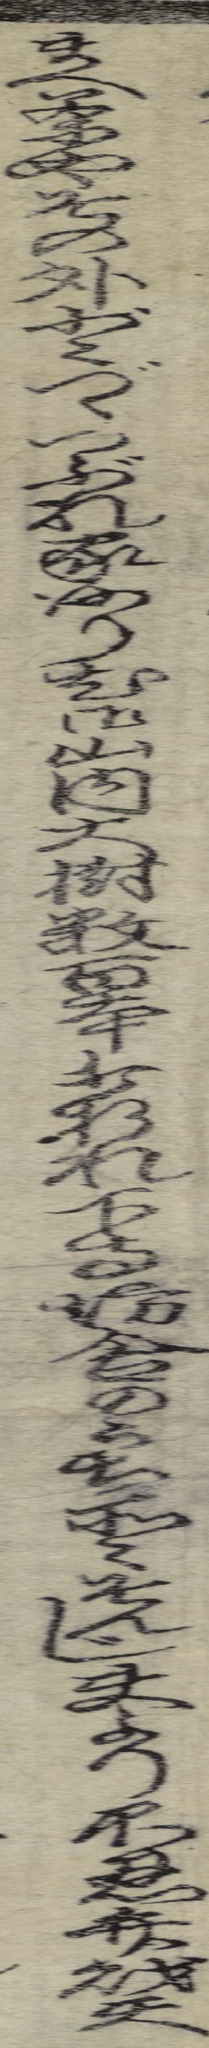まへ茶やその外少〻づゝつぶれ家あり尤御山内大樹数百本打折れ下寺坊舎のうち所〻そんじ夫より不忍弁財天
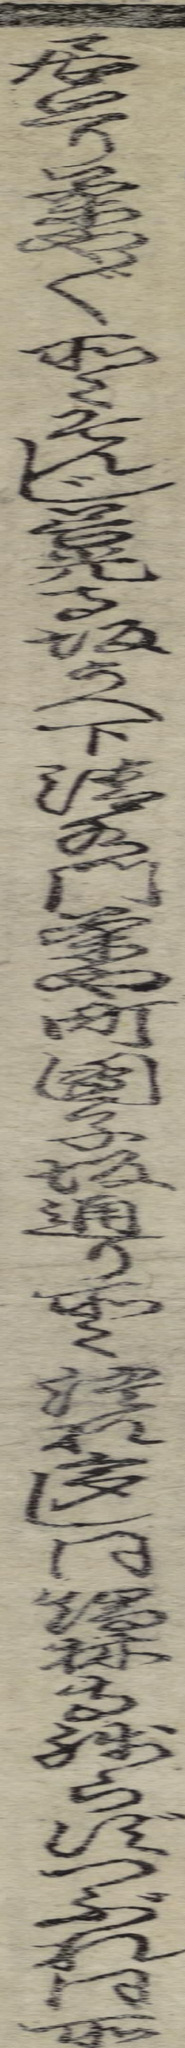居廻り茶や〴〵所〻そんじ善光寺坂うへ下清水門茶や町団子坂通り所〻潰れ多し同燭林寺残らずつぶれ同所
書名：江戸十里四方大風出水焼失　場所附
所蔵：東京大学地震研究所図書室 Earthquake Research Institute Library, The University of Tokyo, JAPAN
